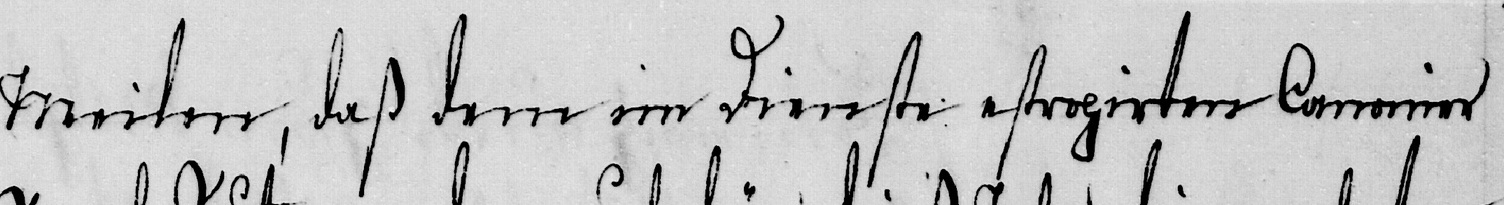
Meilen, daß dem im Dienste estropirten Canonier
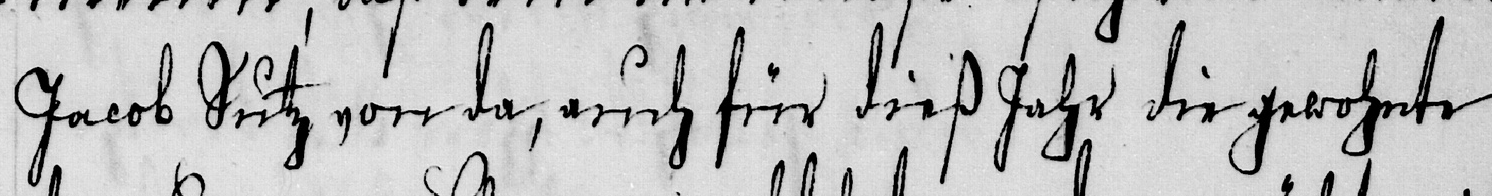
Jacob Sutz von da, auch für dieß Jahr die gewohnte
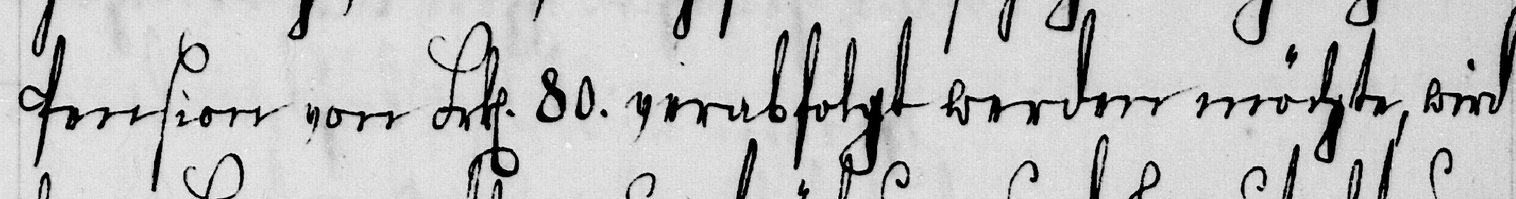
Pension von Frk[en]. 80. verabfolgt werden möchte, wird
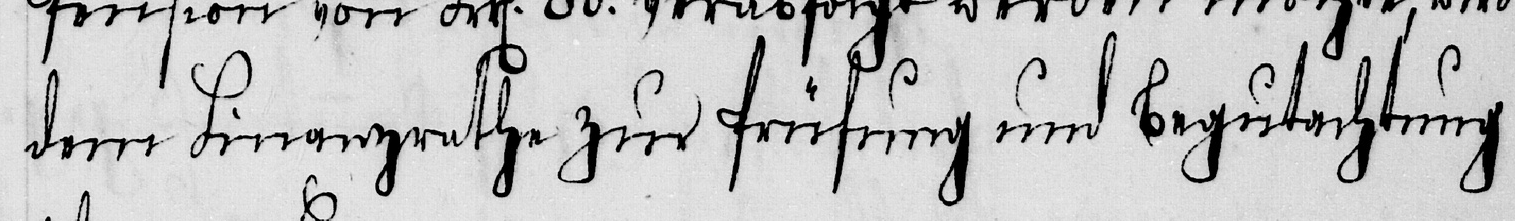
dem Finanzrathe zur Prüfung und Begutachtung
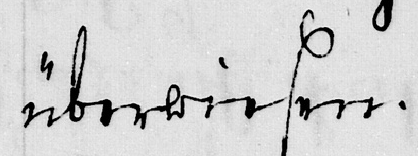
überwiesen.
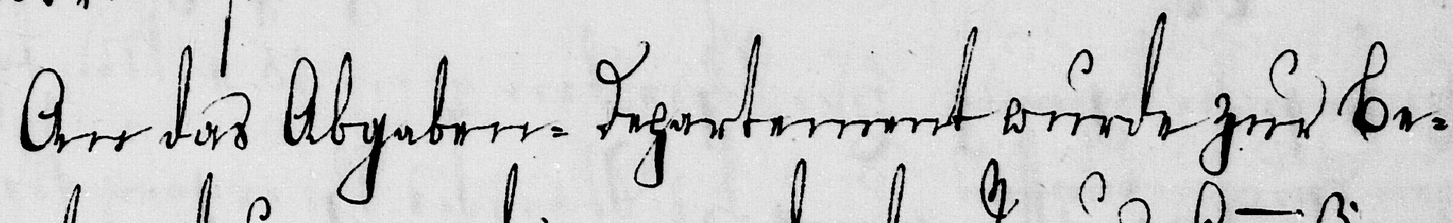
An das Abgaben-Departement wurde zur Be¬
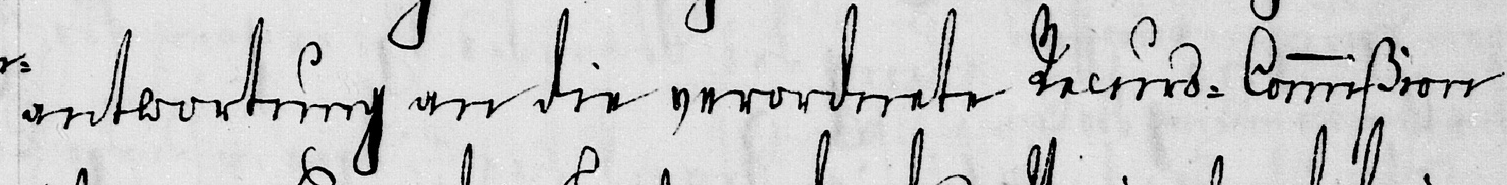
antwortung an die verordnete Recurs-Commißion
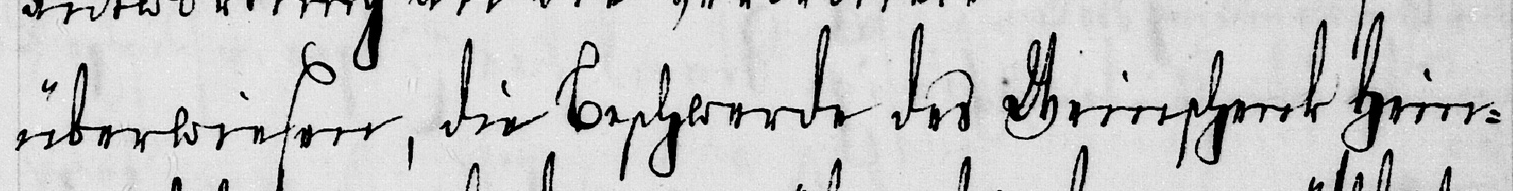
überwiesen, die Beschwerde des Weinschenk Hein¬
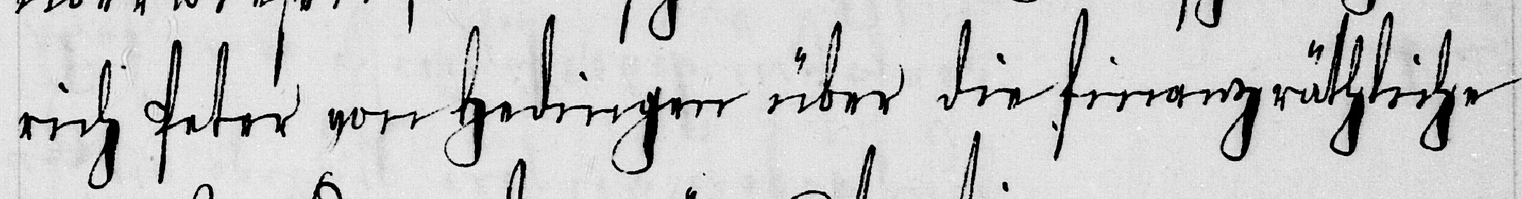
rich Peter von Hedingen über die finanzräthliche
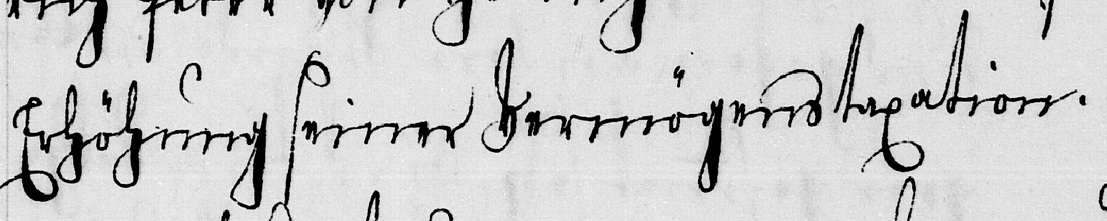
Erhöhung seiner Vermögenstaxation.
